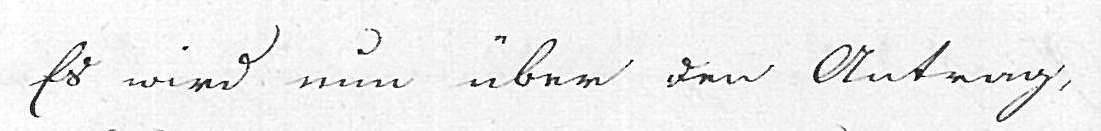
Es wird nur über den Antrag,
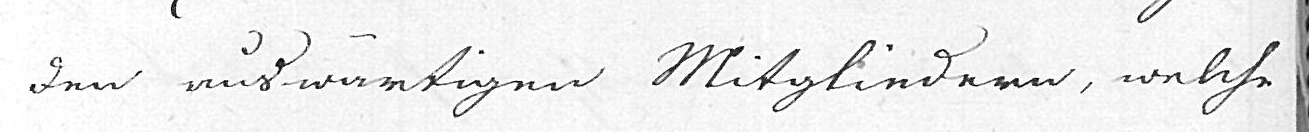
den auswärtigen Mitgliedern, welche
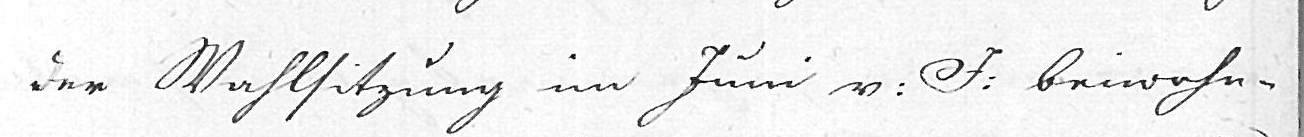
der Wahlsitzung im Juni v: J: beiwohn-
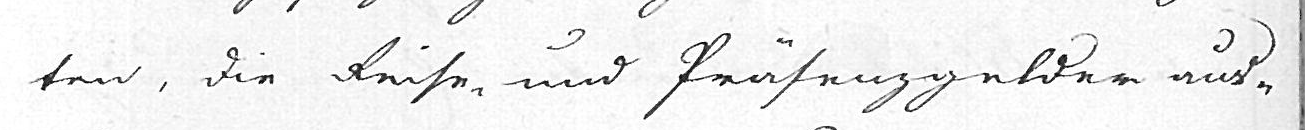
ten, die Reise- und Präsenzgelder aus-
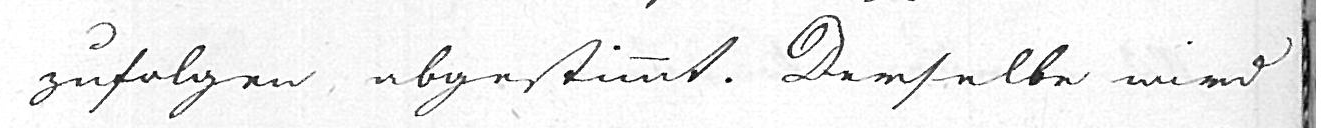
zufolgen, abgestimmt. Derselbe wird
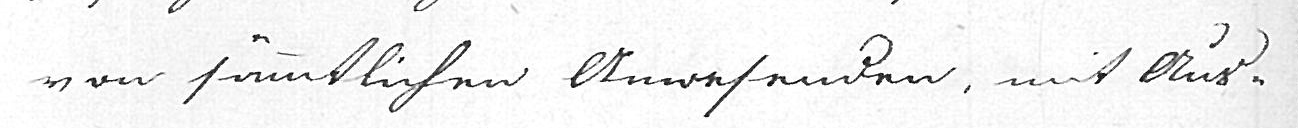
von sämtlichen Anwesenden, mit Aus-
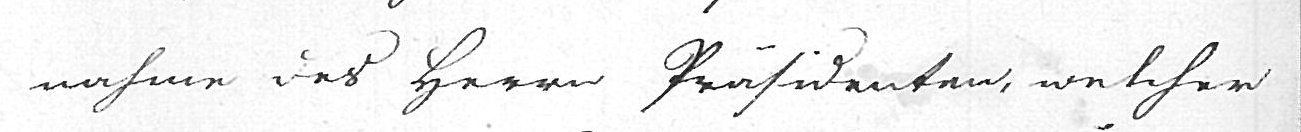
nahme des Herrn Präsidenten, welcher
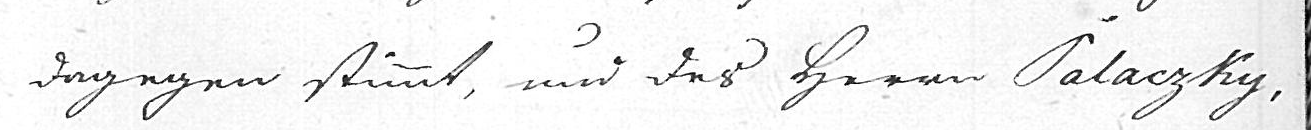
dagegen stimmt, und des Herrn Palazky,
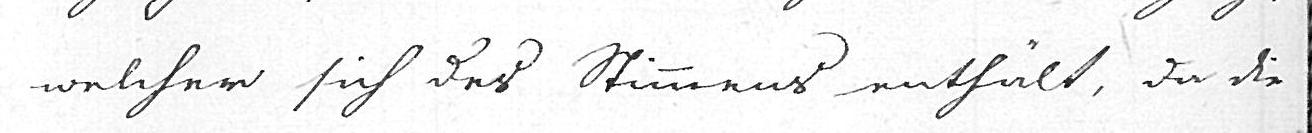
welcher sich des Stimmens enthält, da die
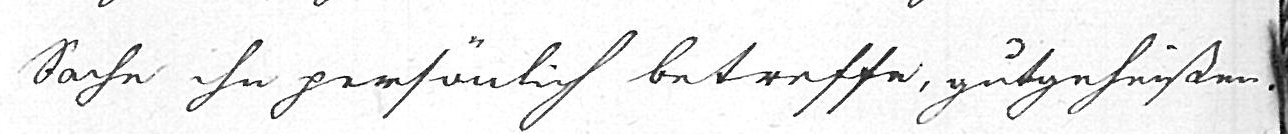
Sache ihn persönlich betreffe, gutgeheißen.
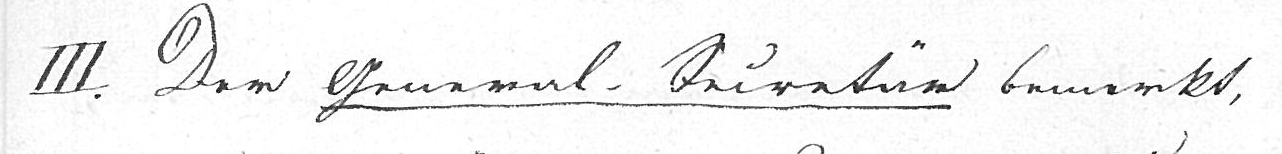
III. Der General-Secretär bemerkt,
